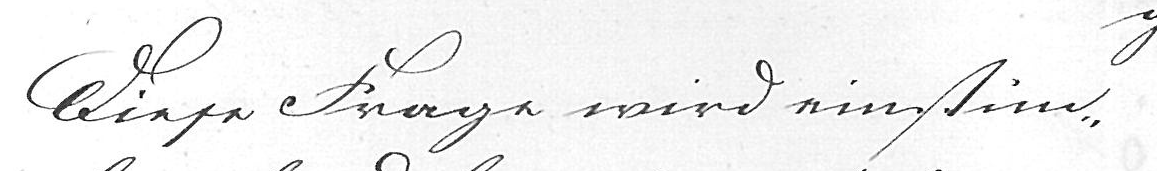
Diese Frage wird einstim-
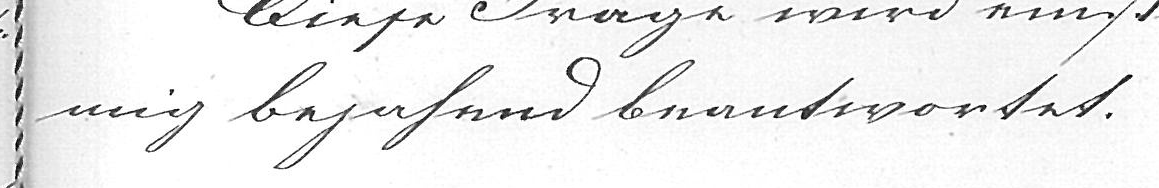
mig und bejahend beantwortet.
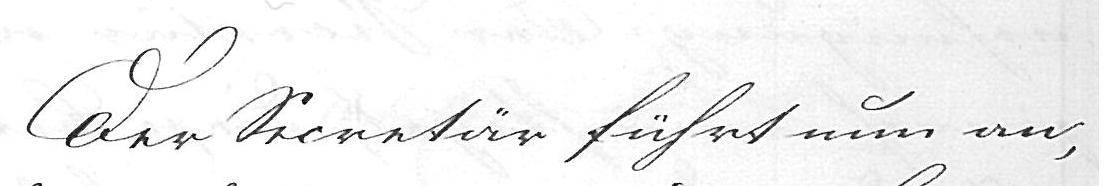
Der Secretär führt nun an,
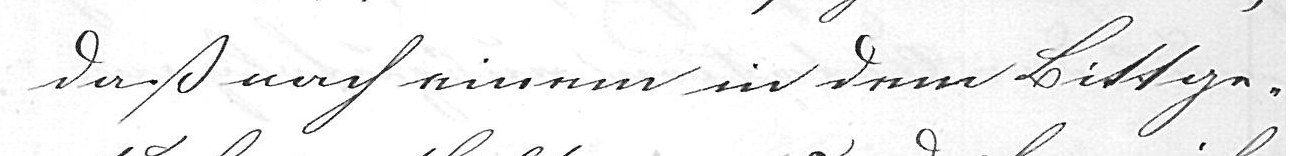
daß nach einem in dem Bittege-
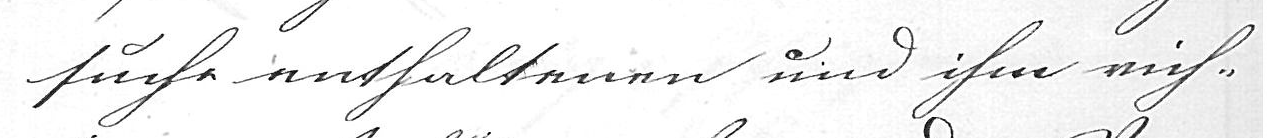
suche enthaltenen und ihm rich-
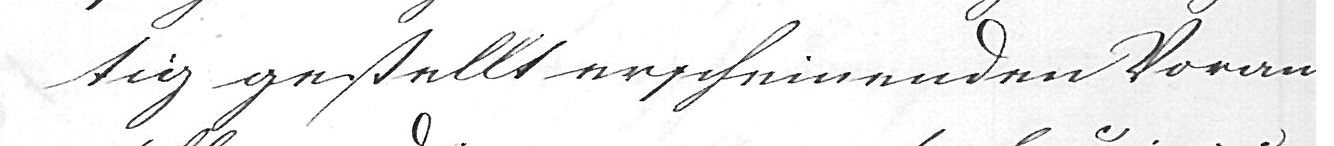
tig gestellt erscheinenden Voran-
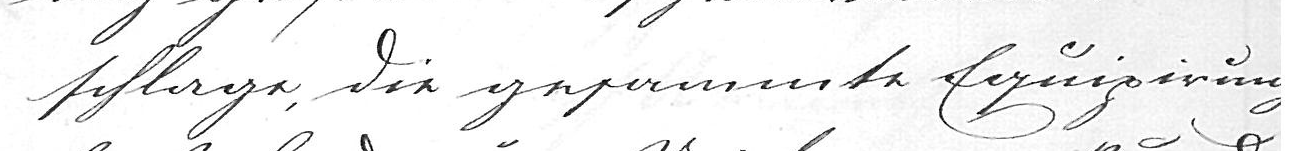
schlage, die gesammte Equipirung,
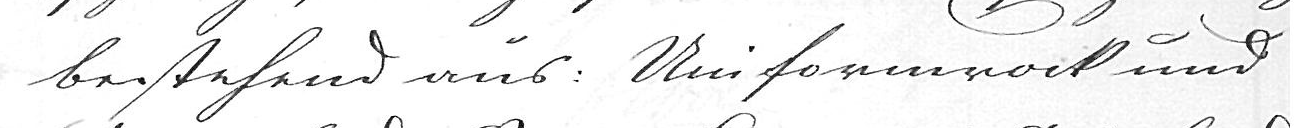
bestehend aus: Uniformrock und
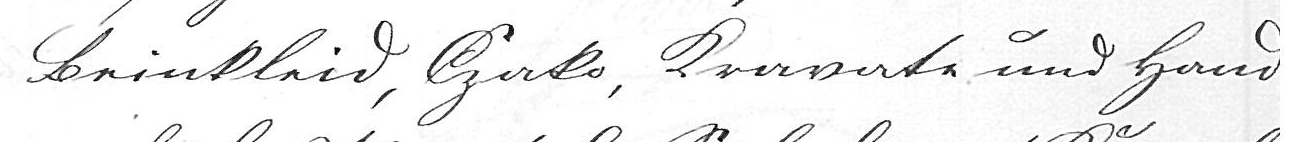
Beinkleid, Szako, Kravate und Hand-
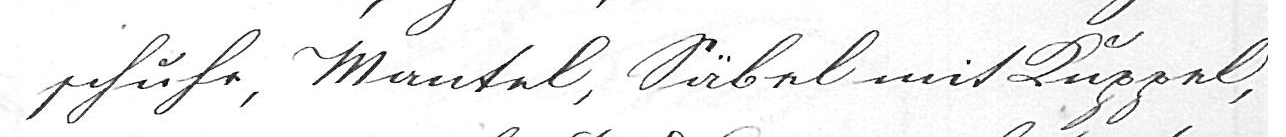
schuhe, Mantel, Säbel mit Kuppel,
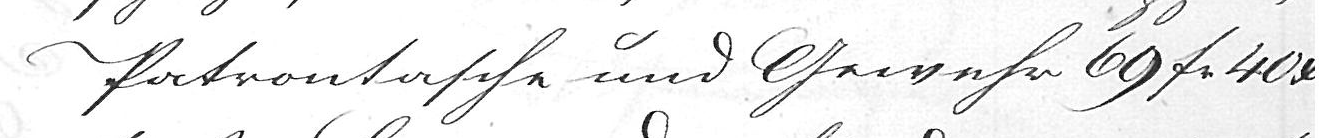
Patrontasche und Gewehr 69 fl 40 kr
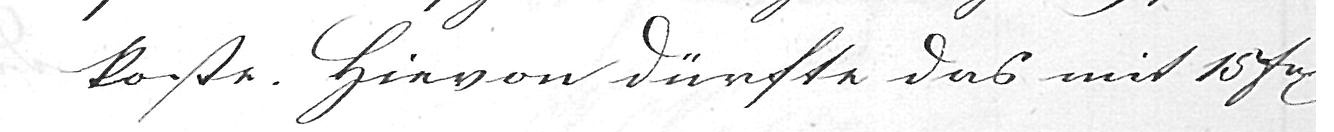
koste. Hiervon dürfte das mit 15 fl
